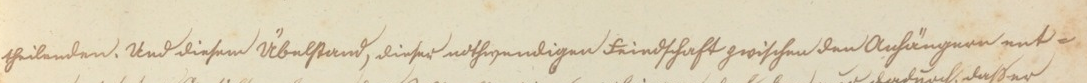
theilenden. Und diesem Übelstand, dieser nothwendigen Feindschaft zwischen den Anhängern ent-
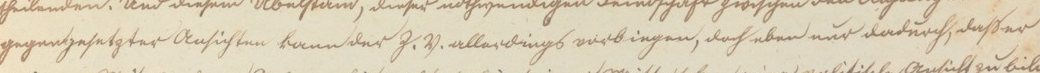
gegengesetzter Ansichten kann der Z.V. allerdings vorbeugen, doch eben nur dadurch, dass er
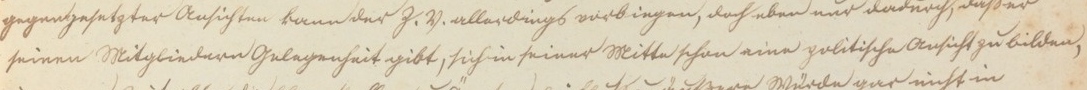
seinen Mitgliedern Gelegenheit gibt, sich in seiner Mitte schon eine politische Ansicht zu bilden,
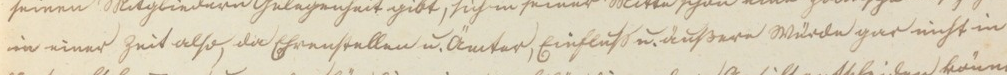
in einer Zeit also, da Ehrenstellen u. Ämter, Einfluss u. äußere Würde gar nicht in
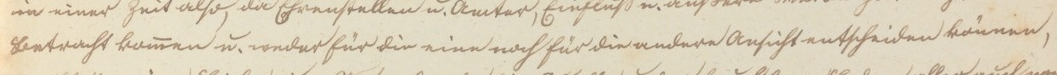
Betracht kommen u. weder für die eine noch für die andere Ansicht entscheiden können,
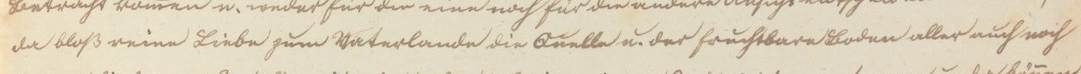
da bloß reine Liebe zum Vaterlande die Quelle u. der fruchtbare Boden aller auch noch
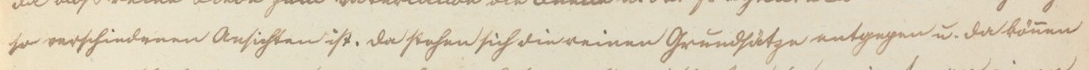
so verschiedenen Ansichten ist. Da stehen sich die reinen Grundsätze entgegen u. da können
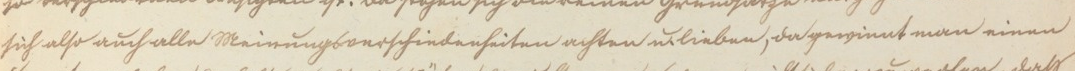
sich also auch alle Meinungsverschiedenheiten achten u. lieben, da gewinnt man einen
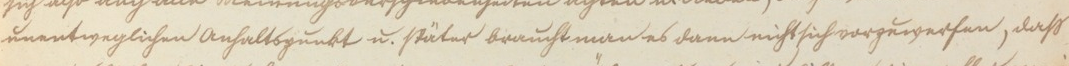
unentweglichen Anhaltspunkt u. später braucht man es dann nicht sich vorzuwerfen, dass
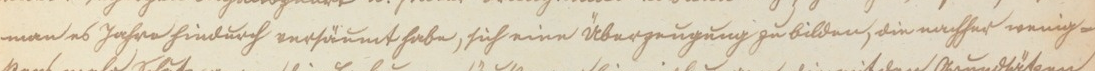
man es Jahre hindurch versäumt habe, sich eine Überzeugung zu bilden, die nachher wenig-
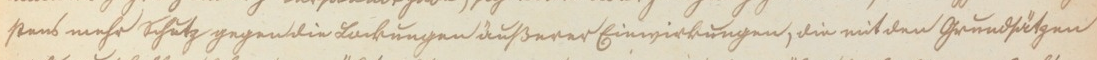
stens mehr Schutz gegen die Lockungen äußerer Einwirkungen, die mit den Grundsätzen
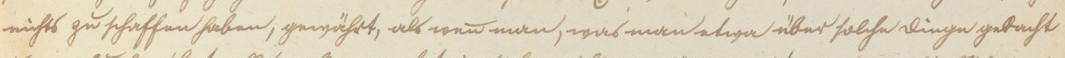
nichts zu schaffen haben, gewährt, als wenn man, was man etwa über solche Dinge gedacht
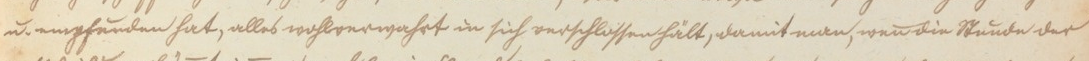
u. empfunden hat, alles wohlverwahrt in sich verschlossen hält, damit man, wenn die Stunde der
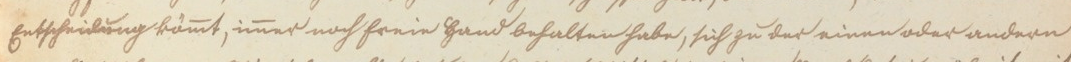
Entscheidung kömmt, immer noch freie Hand behalten habe, sich zu der einen oder andern
